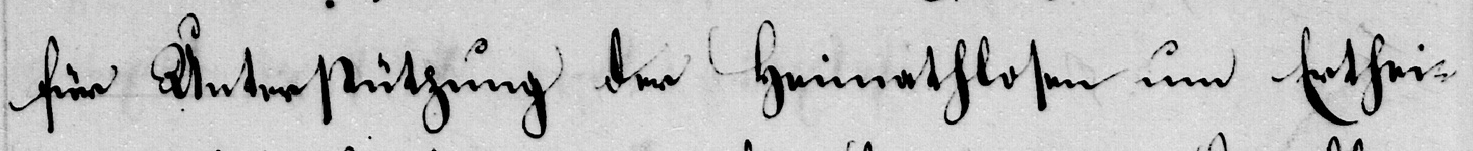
für Unterstützung der Heimathlosen um Erthei¬
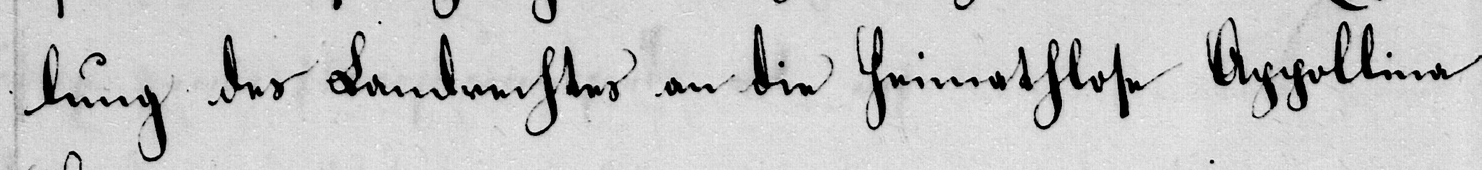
lung des Landrechtes an die heimathlose Appollina
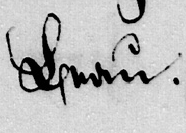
Brau.
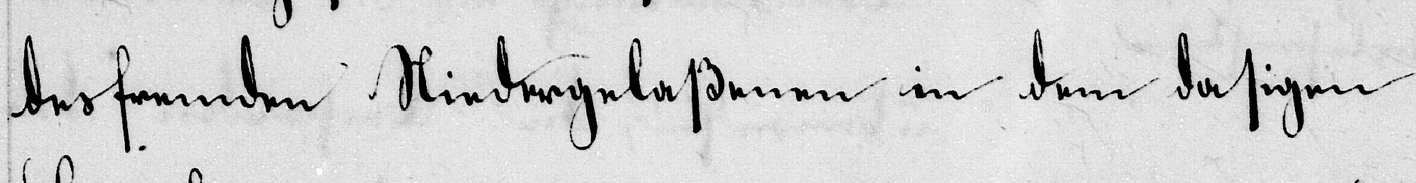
desfremden Niedergelaßenen in dem dasigen
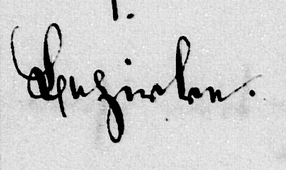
Bezirke.
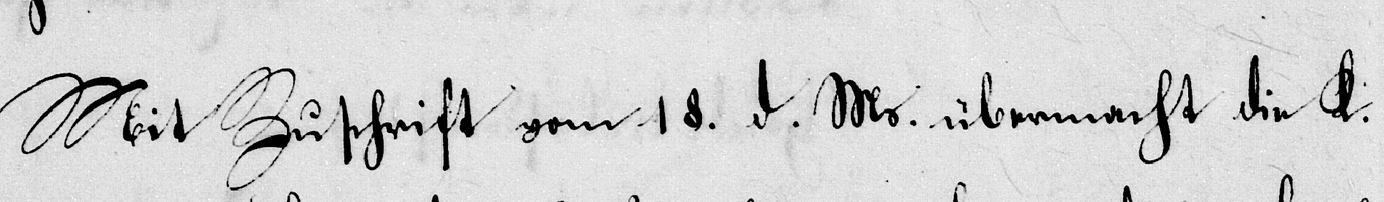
Mit Zuschrift vom 18. d. Ms. übermacht die K.
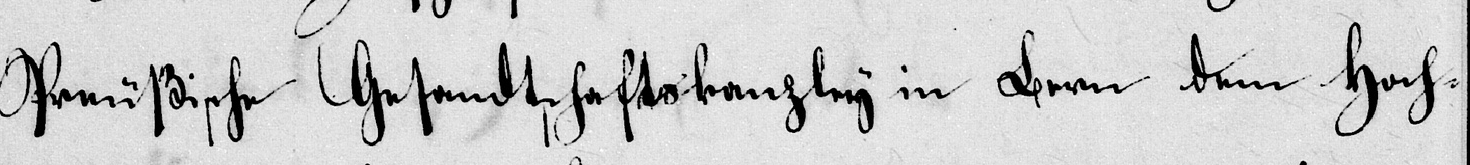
Preußische Gesandtschaftskanzley in Bern dem Hoch¬
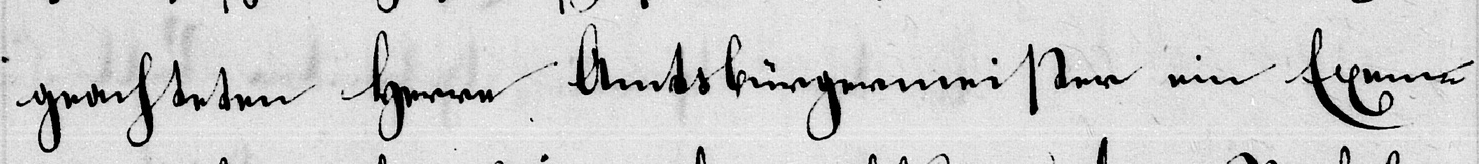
geachteten Herrn Amtsbürgermeister ein Exem¬
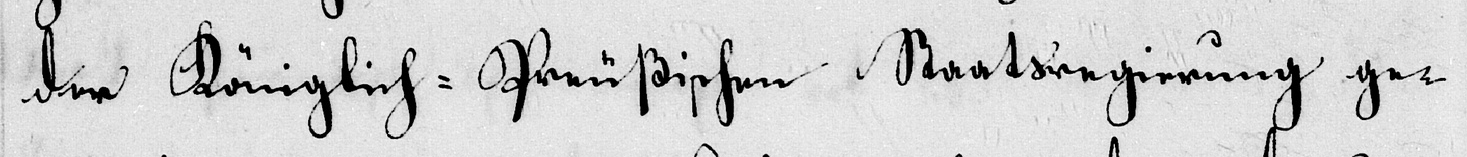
der Königlich-Preußischen Staatsregierung ge¬
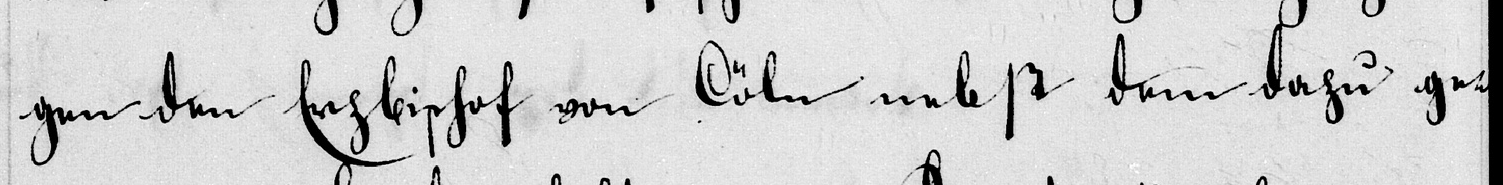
gen den Erzbischof von Cöln nebst dem dazu ge¬
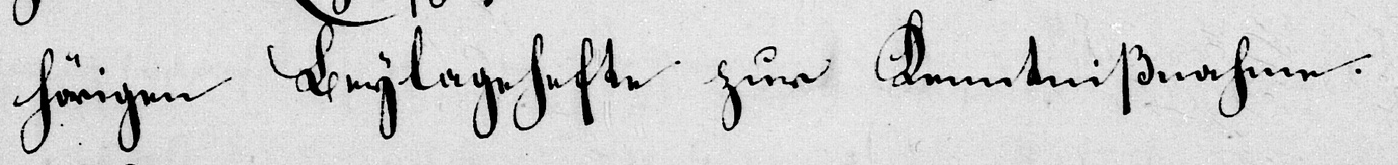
hörigen Beylagehefte zur Kenntnißnahme.
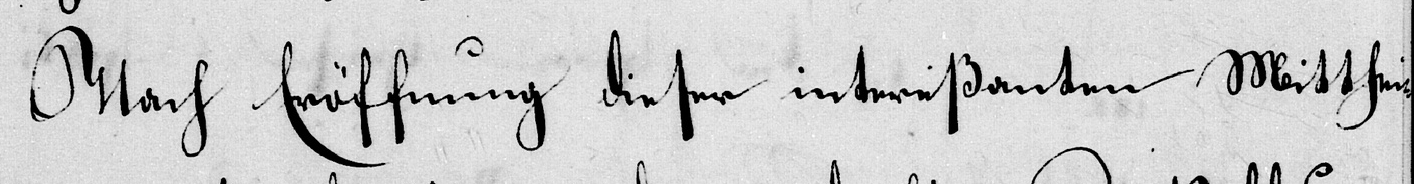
Nach Eröffnung dieser intereßanten Mitthe¬
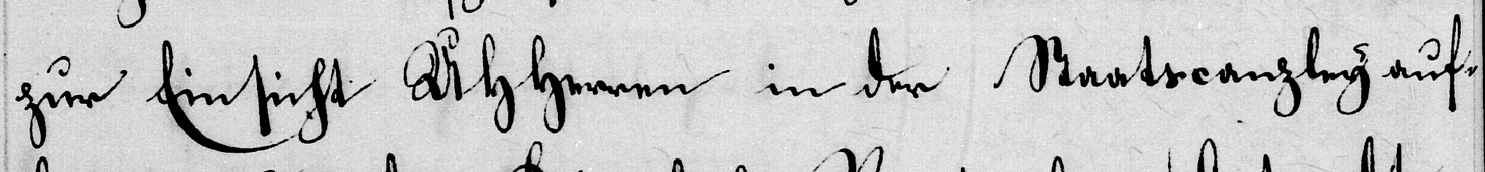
zur Einsicht UHHerren in der Staatscanzley auf¬
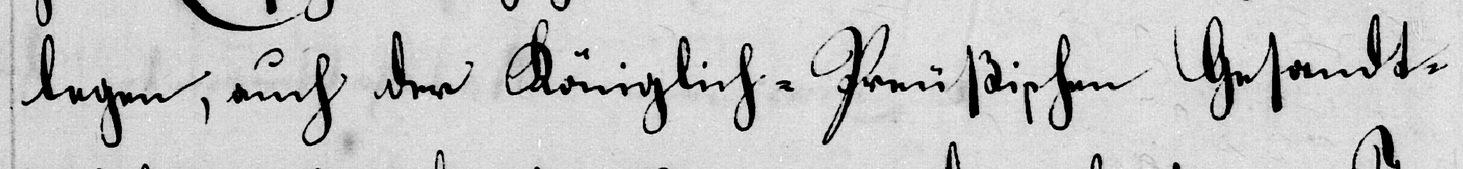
legen, auch der Königlich-Preußischen Gesandt¬
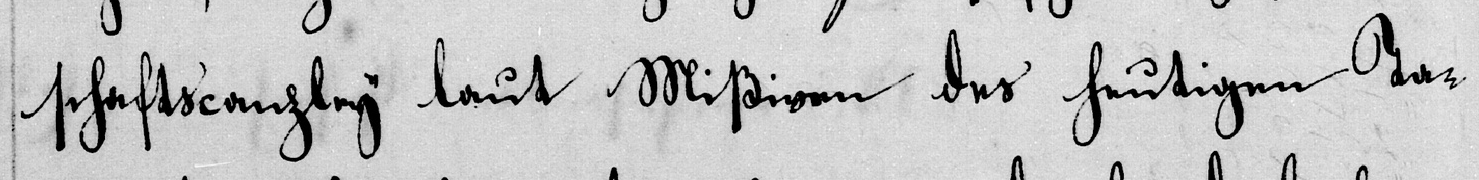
schaftscanzley laut Mißiven des heutigen Ta¬
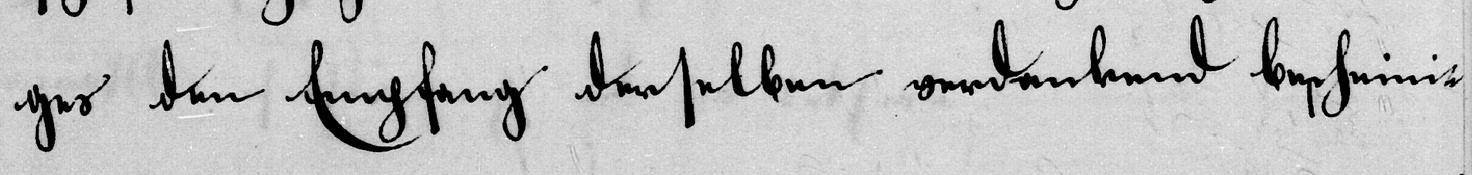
ges den Empfang derselben verdankend bescheini-
